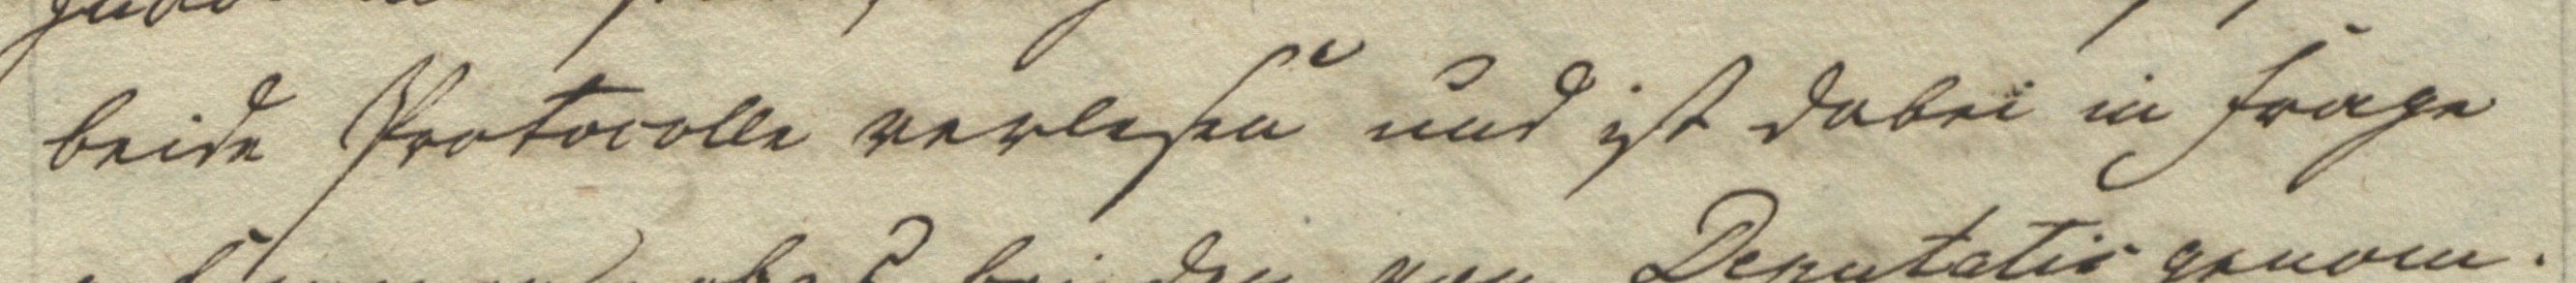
beide Protocolle verlesen und ist dabei in Frage
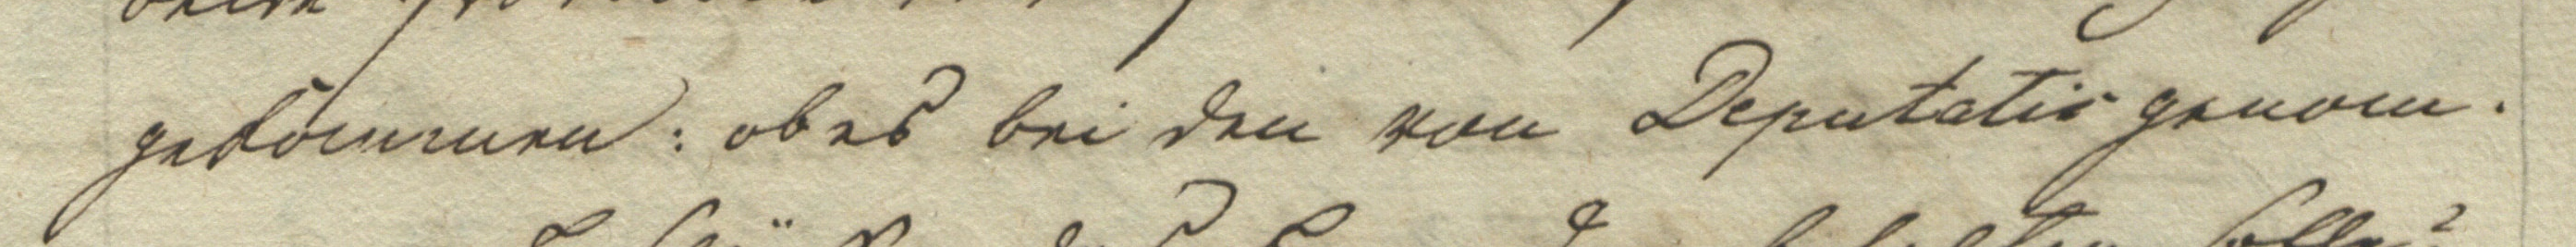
gekommen: ob bei den von Deputatis genom¬
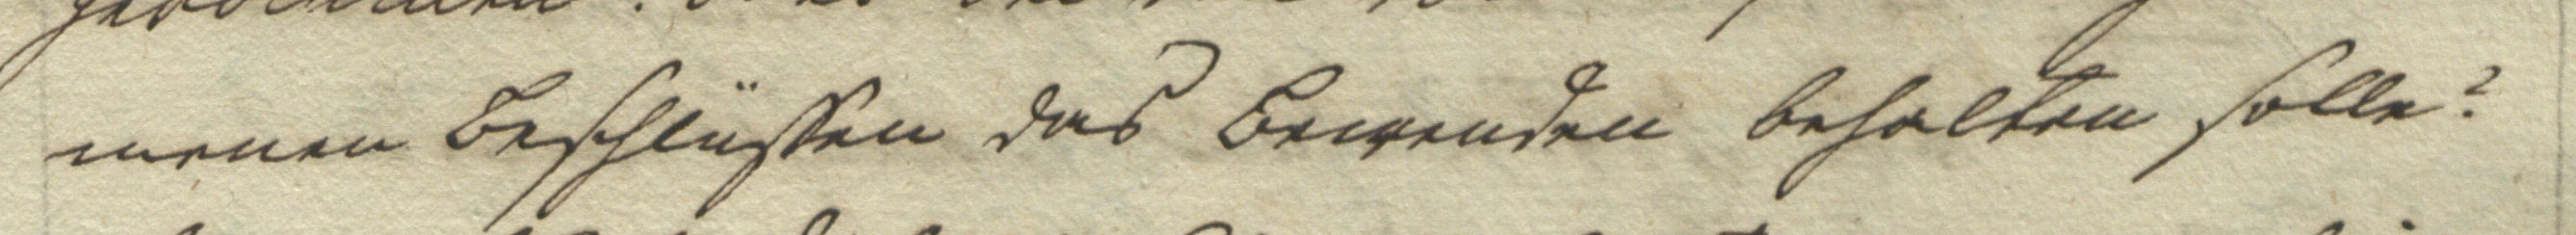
menen Beschlüssen das Bewenden behalten solle?
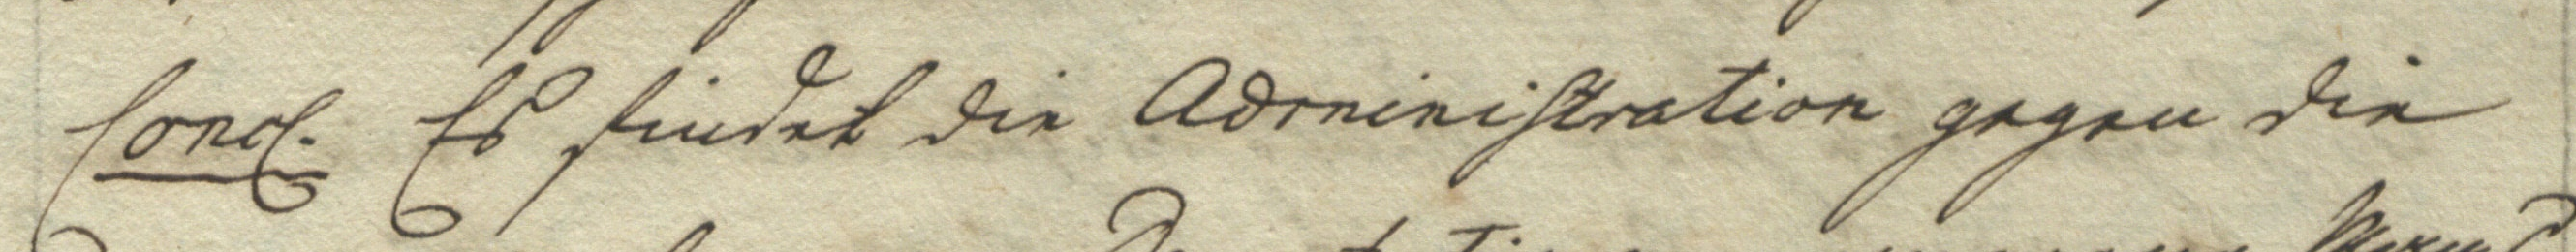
Concl. Es findet die Administration gegen die
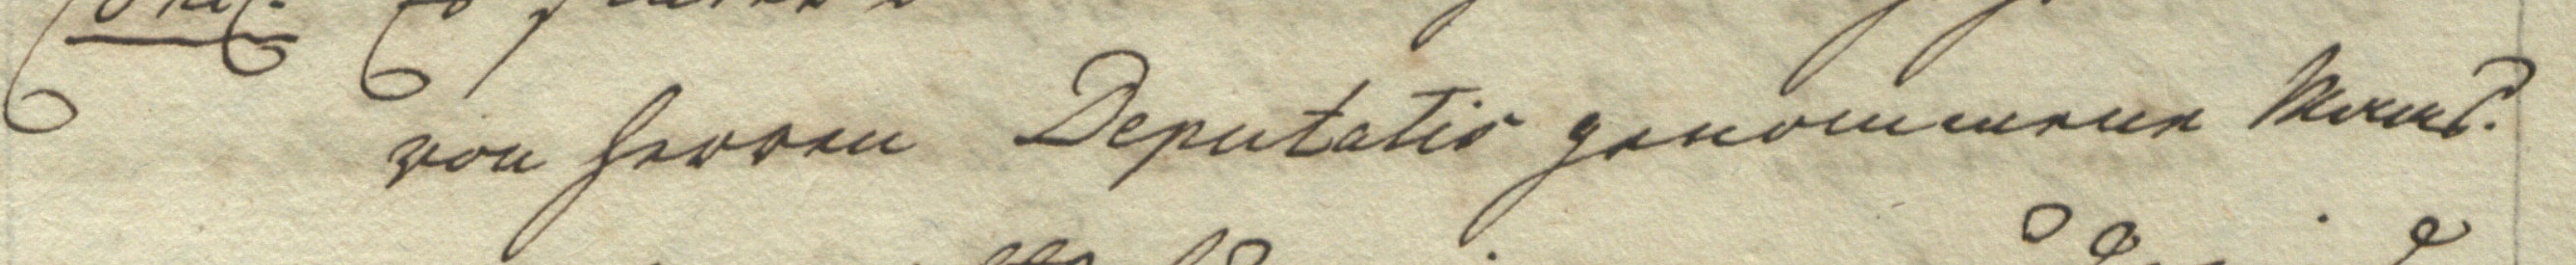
von Herrn Deputatis genommene Maas¬
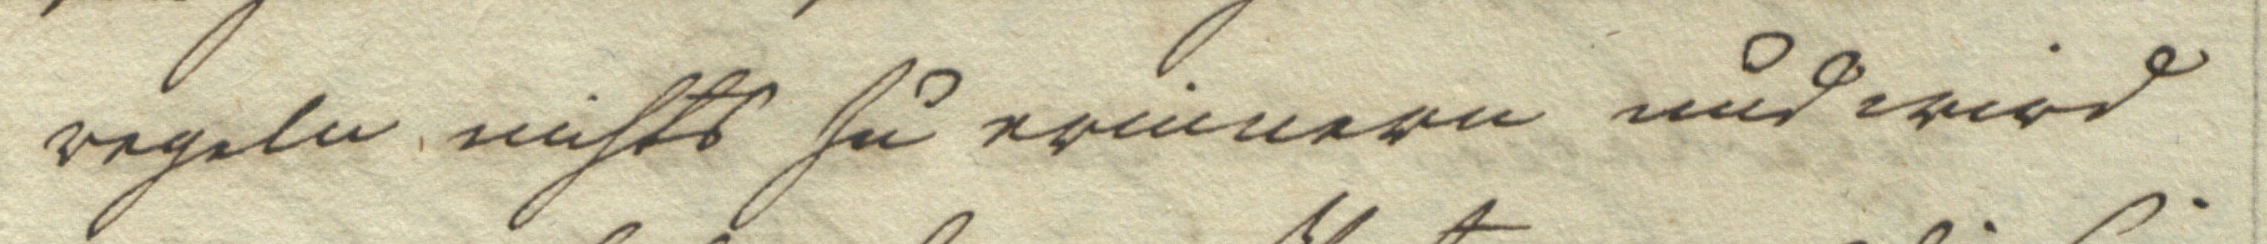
regeln nichts zu erinnern und wird
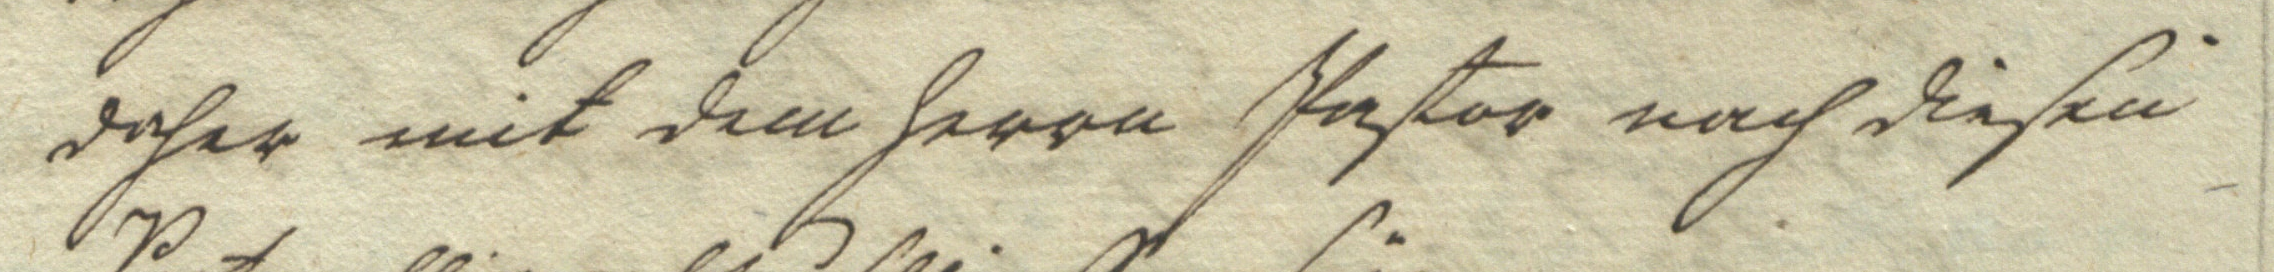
daher mit dem Herrn Pastor nach diesen
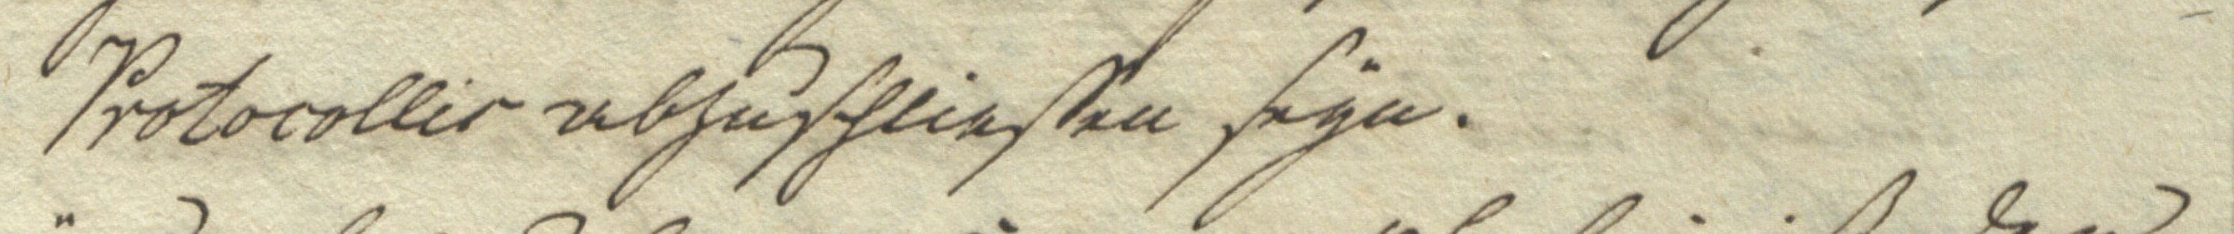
Protocollis abzuschliessen seyn.
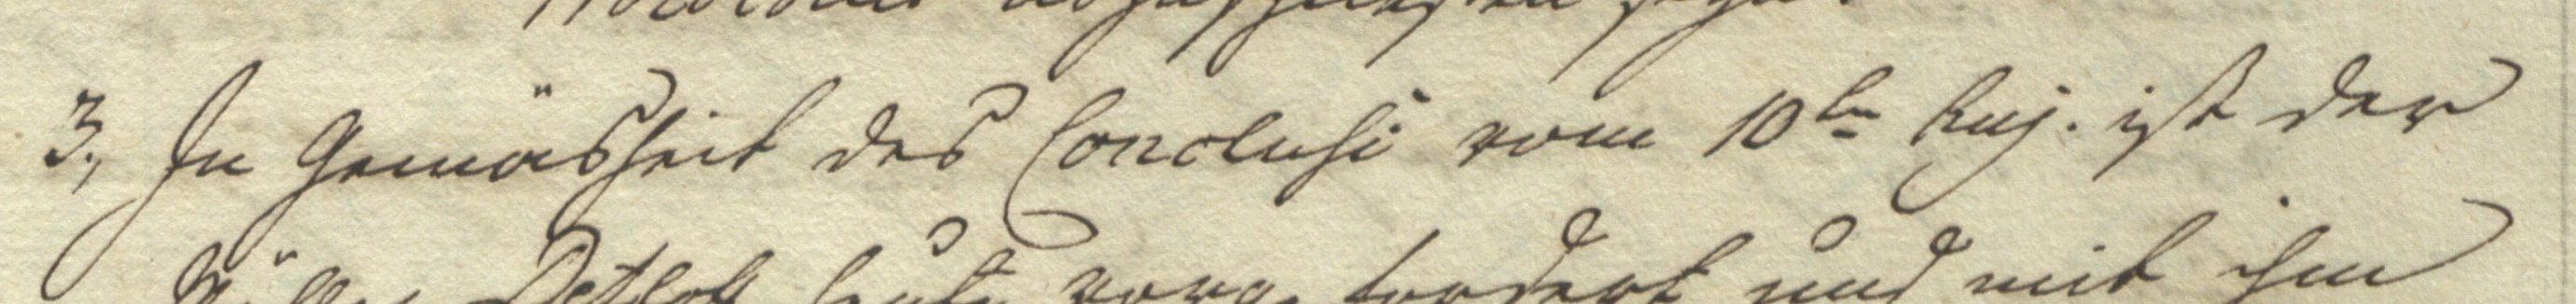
3., In Gemäsheit des Conclusi vom 10ten huj. ist der
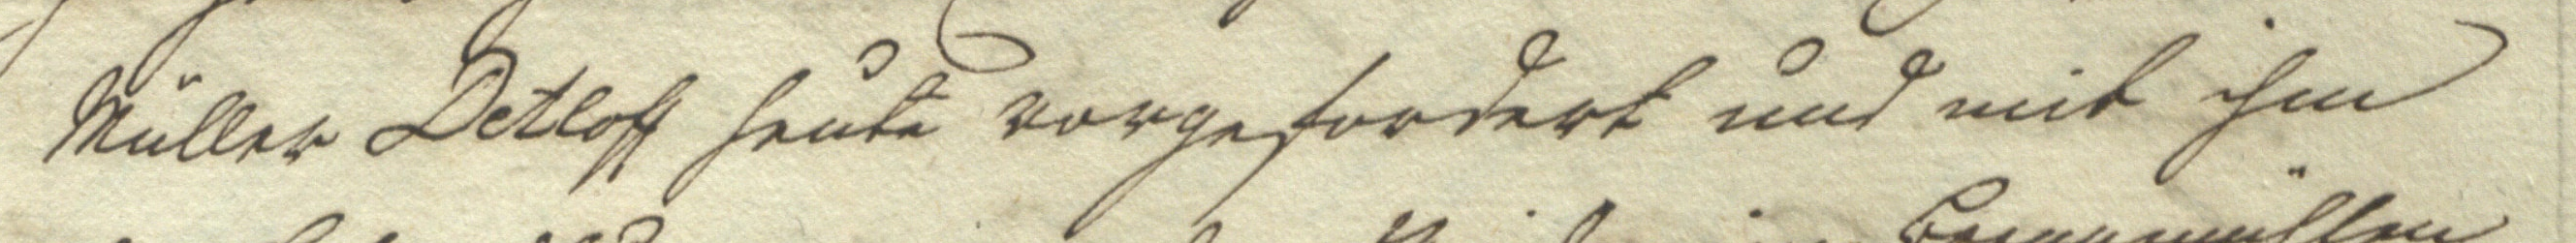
Müller Detloff heute vorgefordert und mit ihm
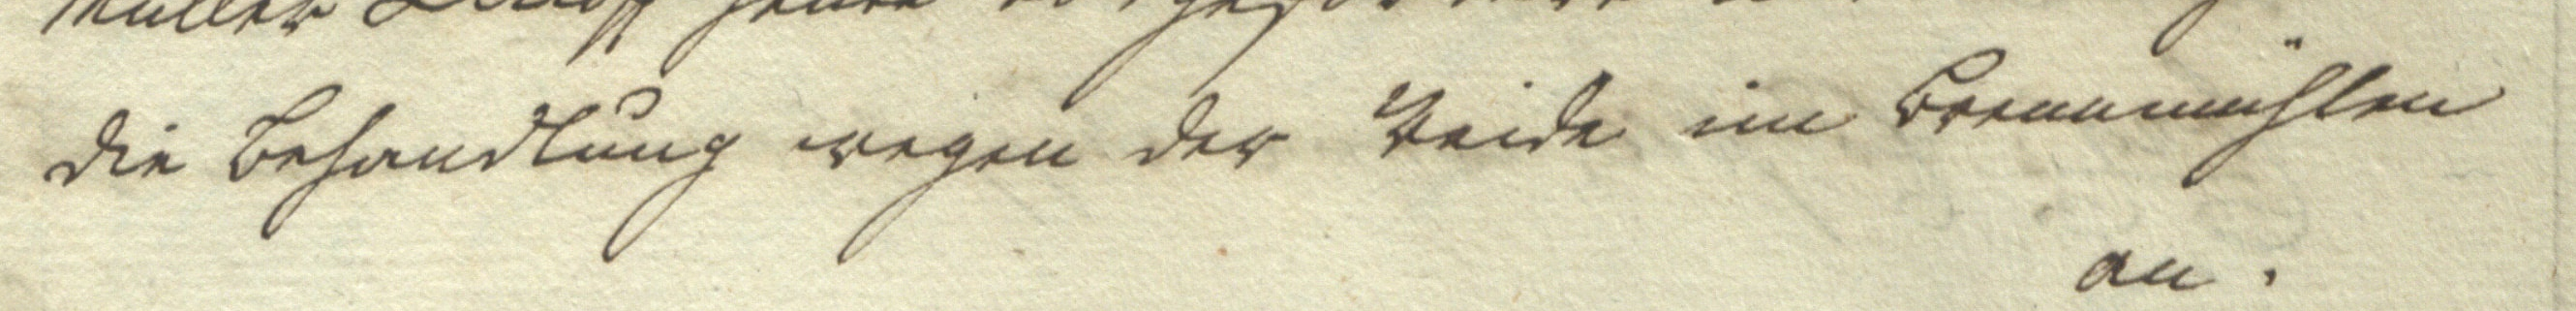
die Behandlung wegen der Weide im Brennmühlen
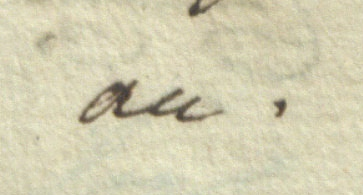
an¬
